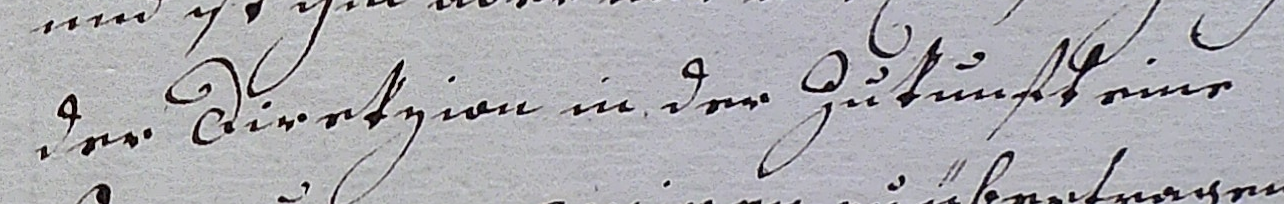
der Direkzion in der Zukunft eine
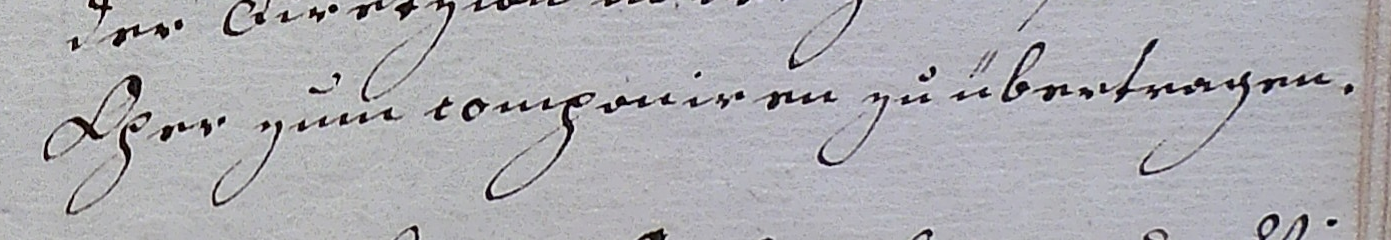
Oper zum componiren zu übertragen.
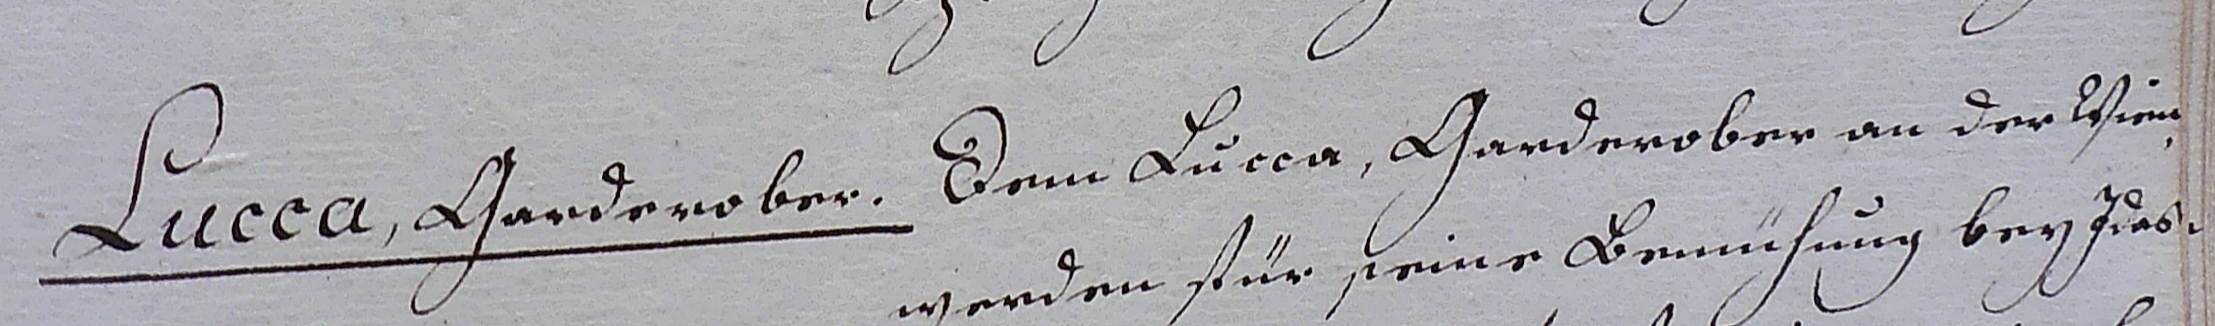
Lucca, Garderober. Dem Lucca, Garderober an der Wien
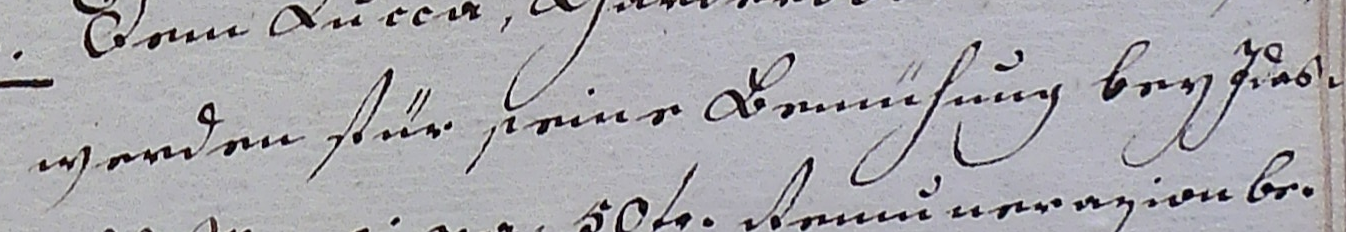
werden für seine Bemühung bey Idas
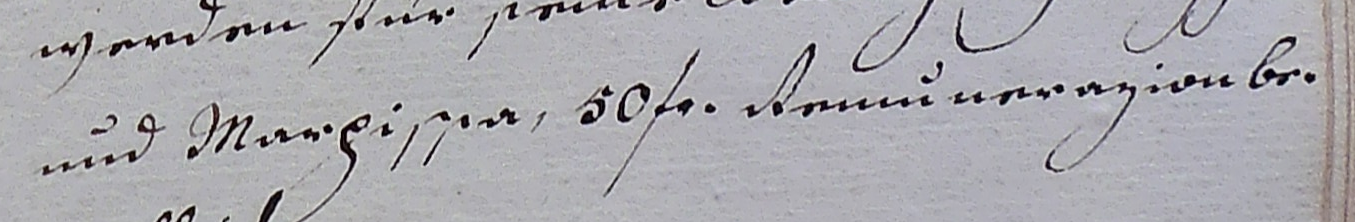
und Marpissa, 50fr. Remunerazion be¬
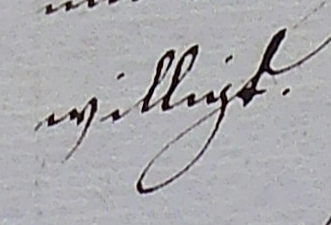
willigt.
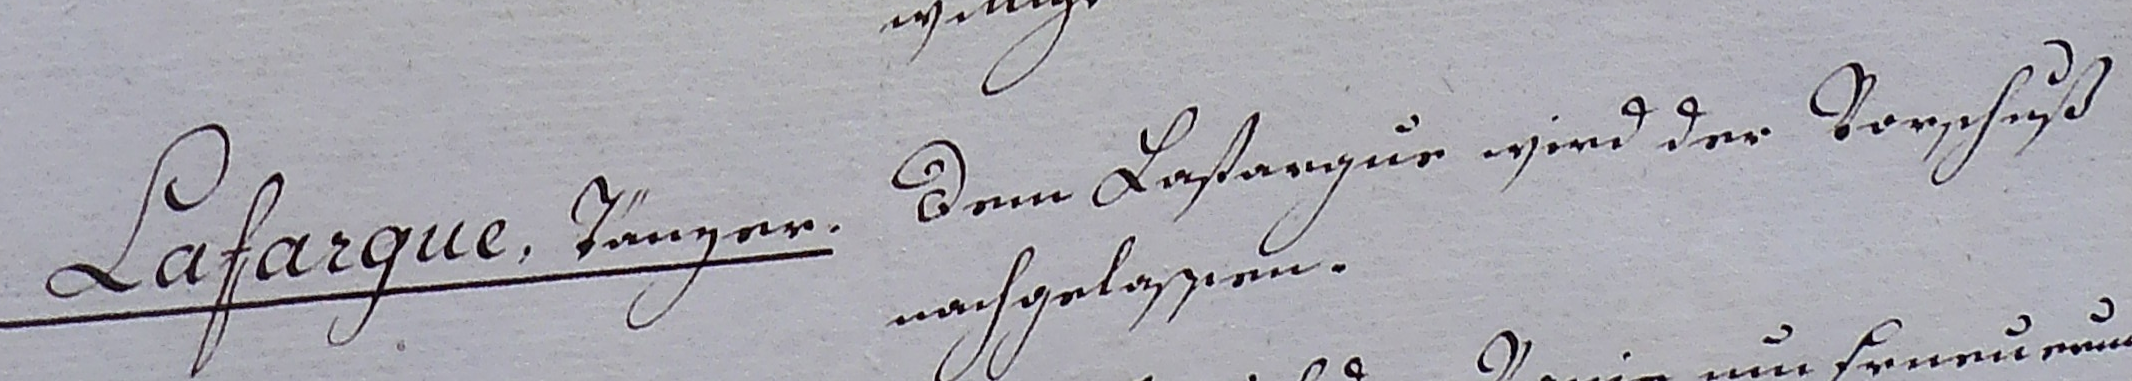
Lafargue, Tänzer. Dem Lafargue wird der Vorschuß
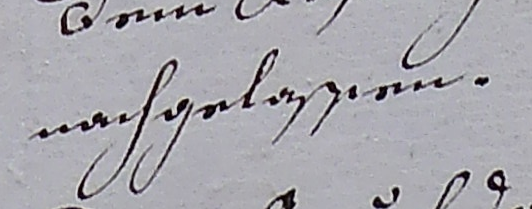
nachgelassen.
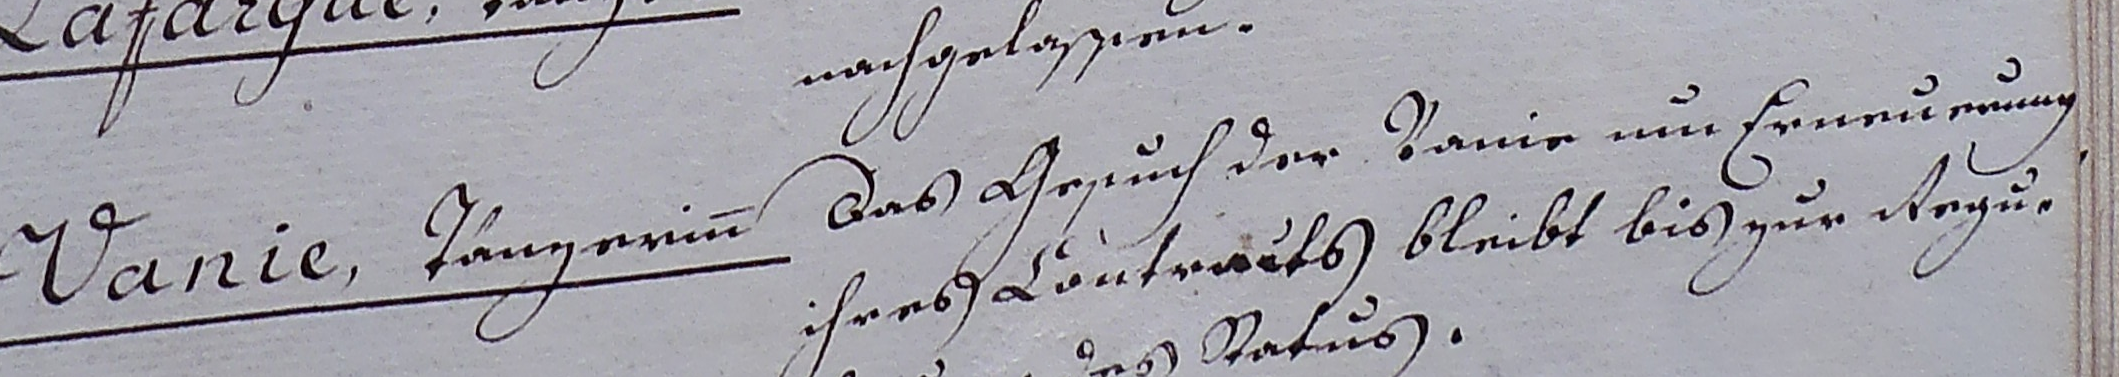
Vanie, Tänzerin̅ Das Gesuch der Vanie um Erneuerung
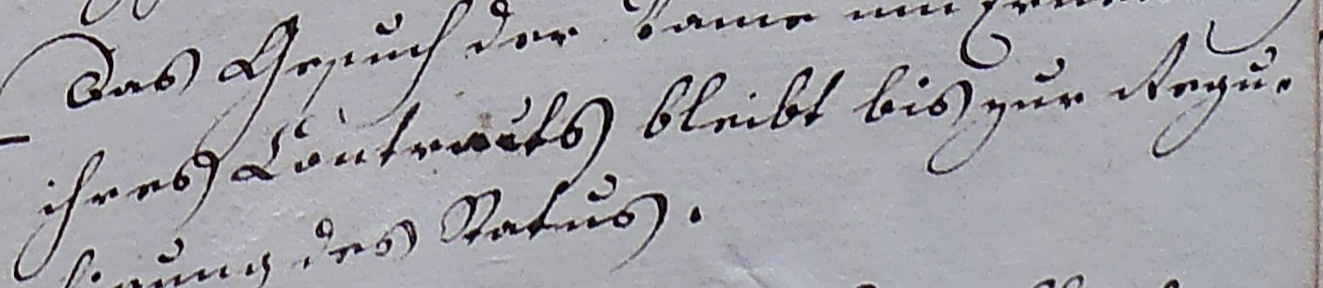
ihres Contracts bleibt bis zur Regu¬
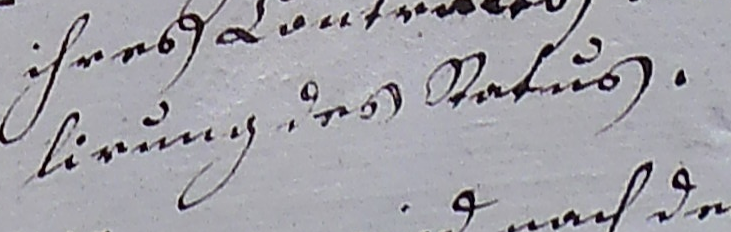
lirung des Status.
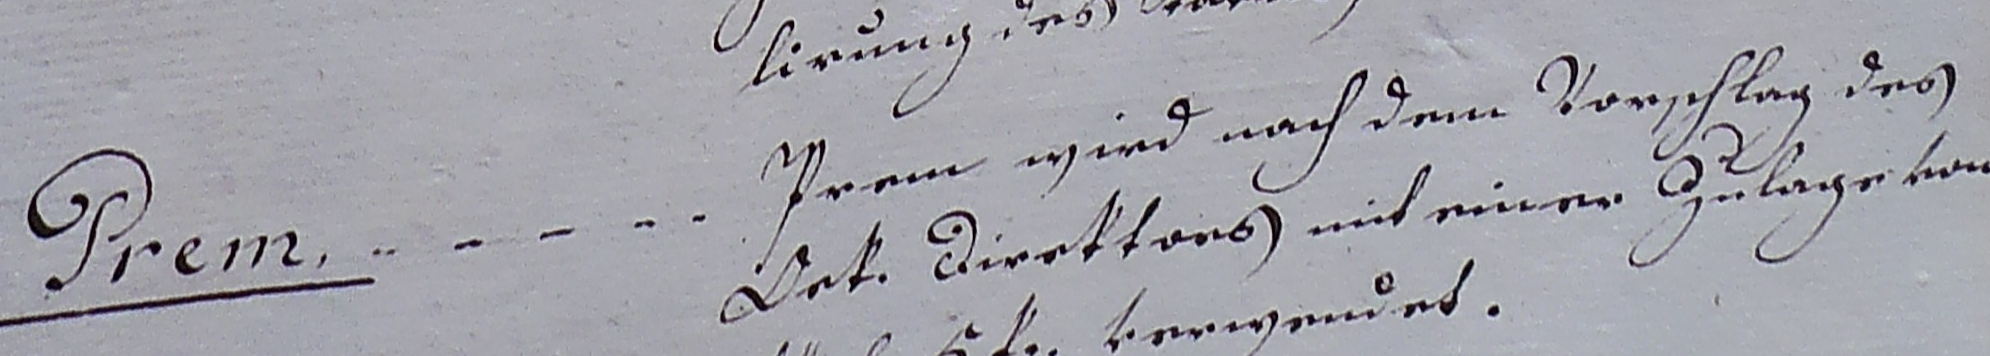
Prem. .. .. .. .. . Prem wird nach dem Vorschlag des
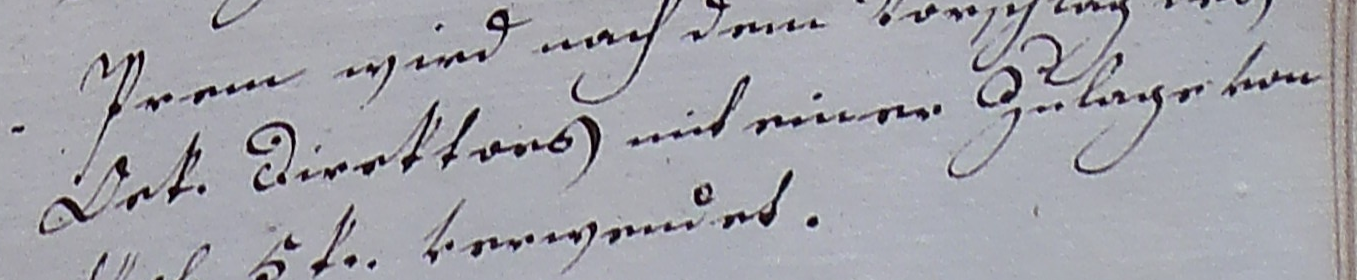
Oek. Direktors, mit einer Zulage von
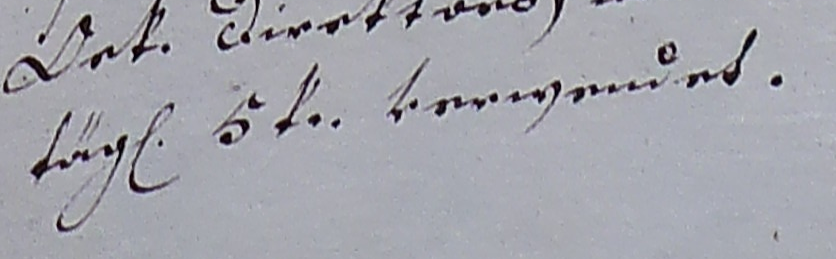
tägl. 5kr. verwendet.
